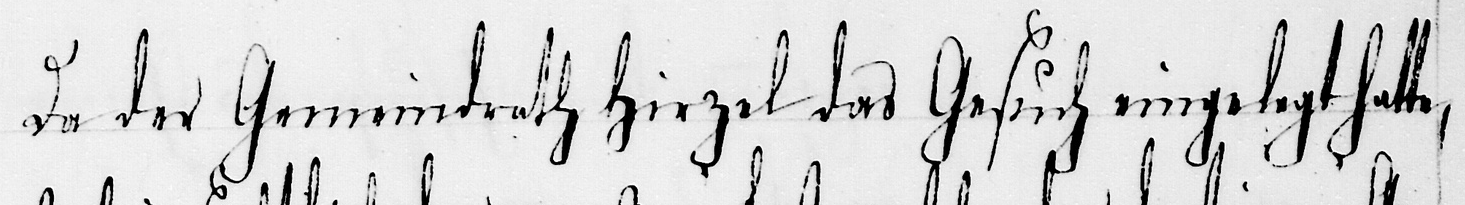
Da der Gemeindrath Hirzel das Gesuch eingelegt hat¬
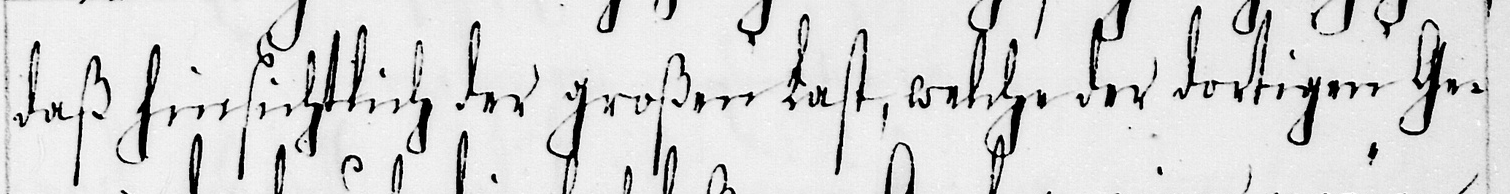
daß hinsichtlich der großen Last, welche der dortigen Ge¬
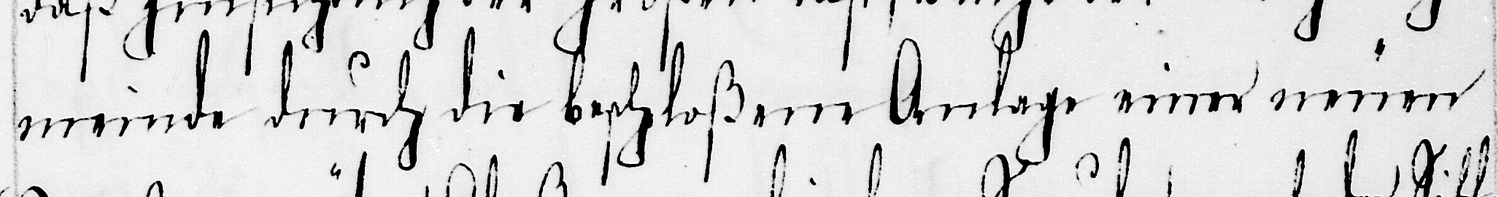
meinde durch die beschloßene Anlage einer neuen
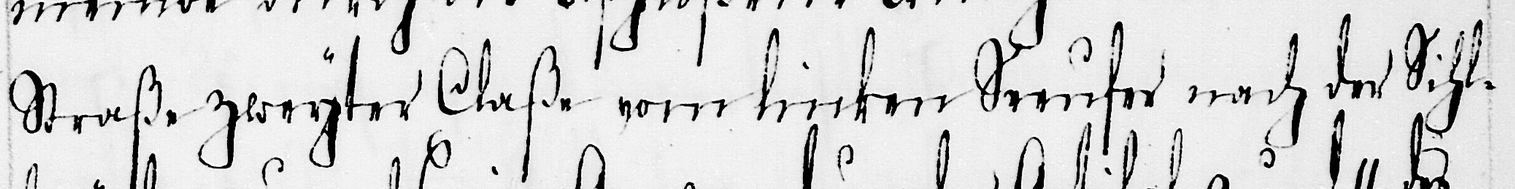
Straße zweyter Claße vom linken Seeufer nach der Sihl¬
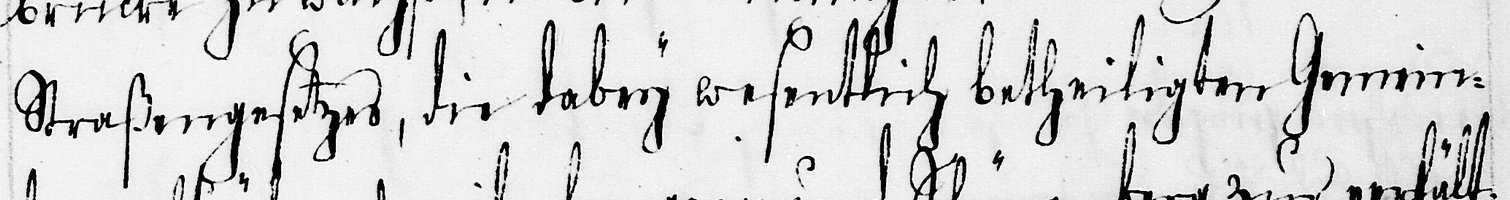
Straßengesetzes, die dabey wesentlich betheiligten Gemein¬
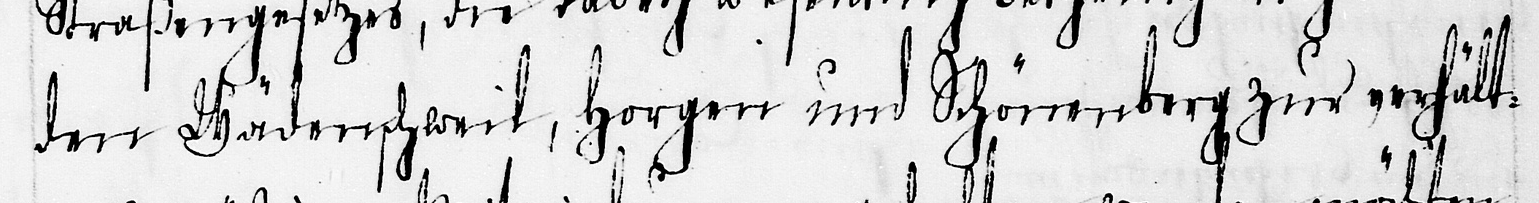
den Wädenschweil, Horgen und Schönenberg zur verhält¬
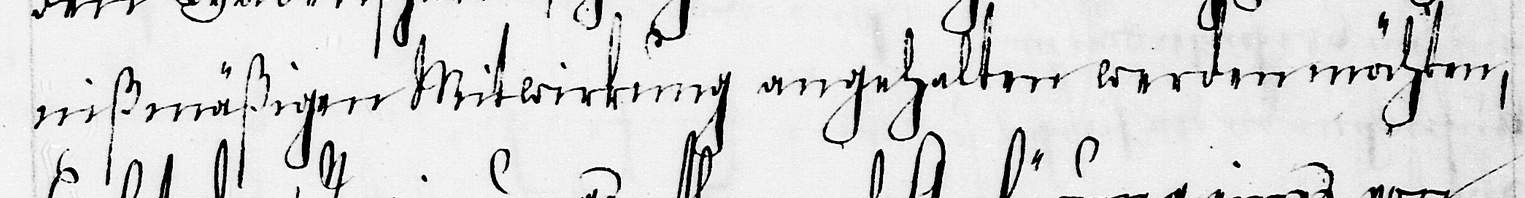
nißmäßigen Mitwirkung angehalten werden möchten,
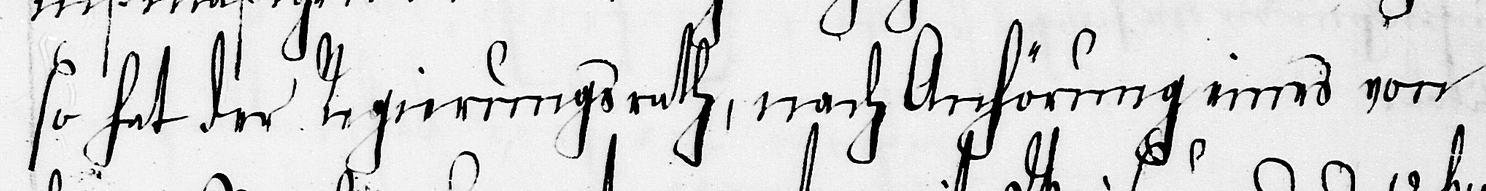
so hat der Regierungsrath, nach Anhörung eines von
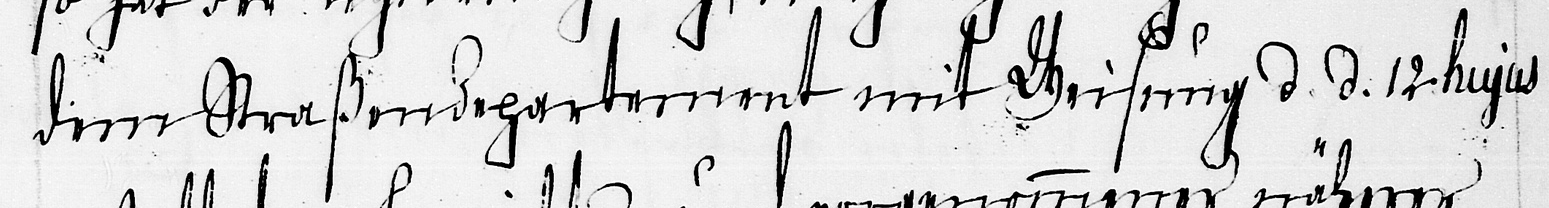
dem Straßendepartement mit Weisung d. d. 12. hujus
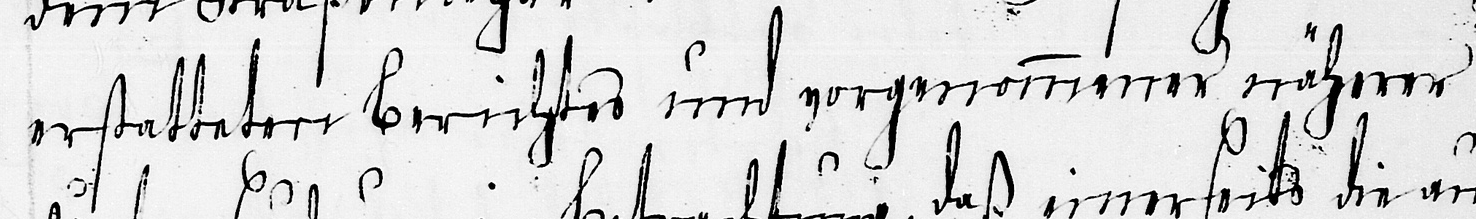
erstatteten Berichtes und vorgenommener näherer
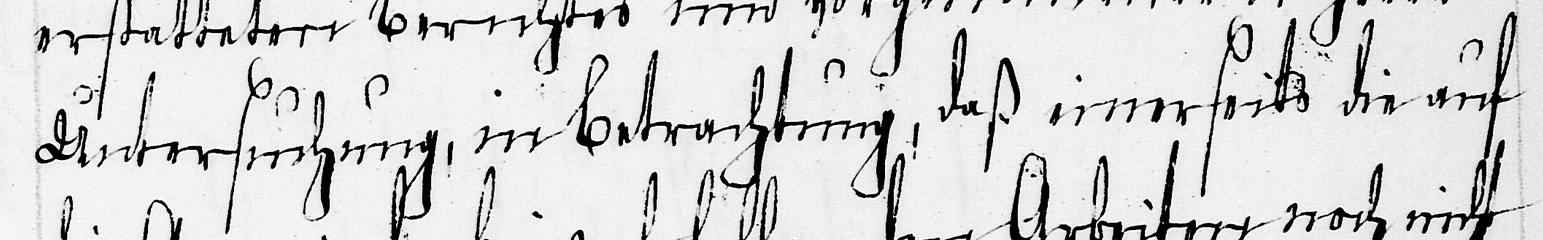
Untersuchung, in Betrachtung, daß einerseits die auf
